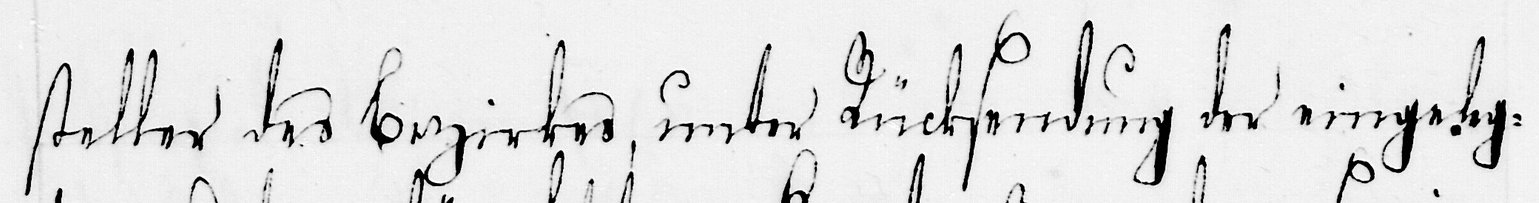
steller des Bezirkes, unter Rücksendung der eingeleg¬
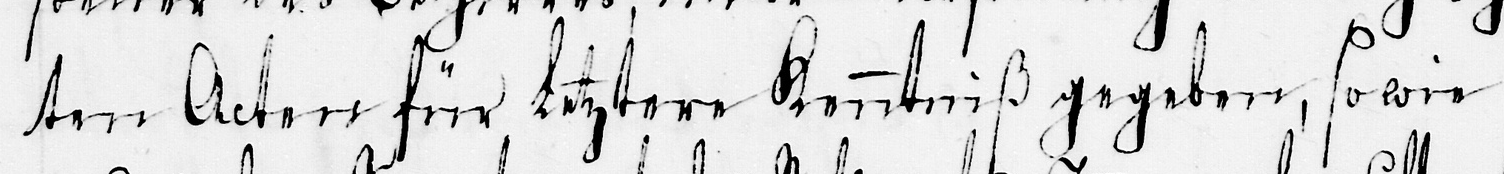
ten Acten für Letztere Kenntniß gegeben, sowie
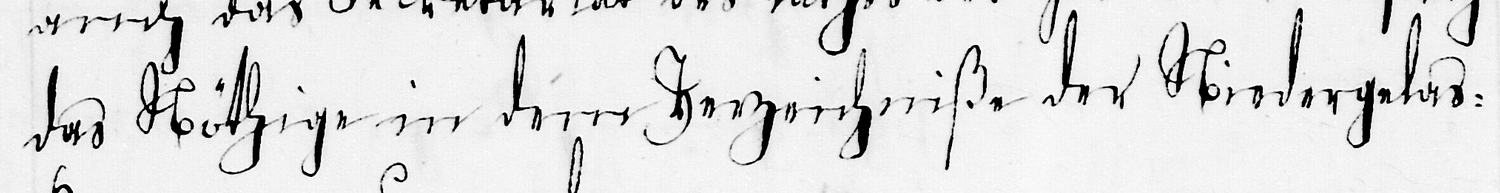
das Nöthige in dem Verzeichniße der Niedergela¬
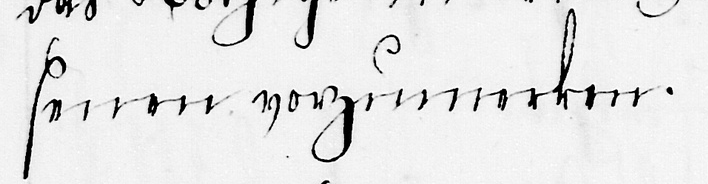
ßenen vorzumerken.
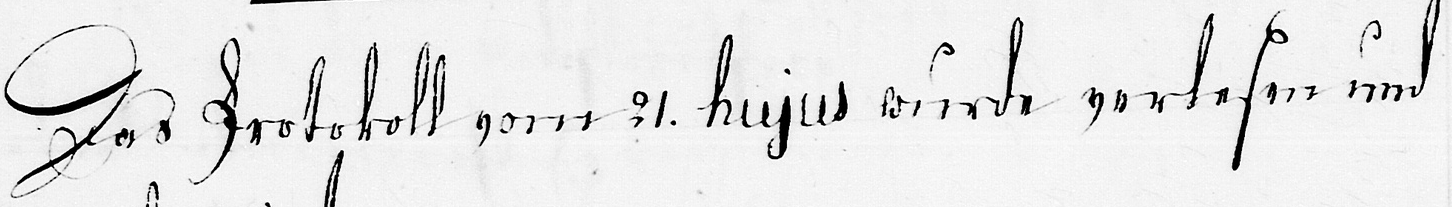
Das Protokoll vom 21. hujus wurde verlesen und
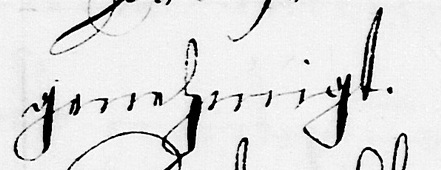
genehmigt.
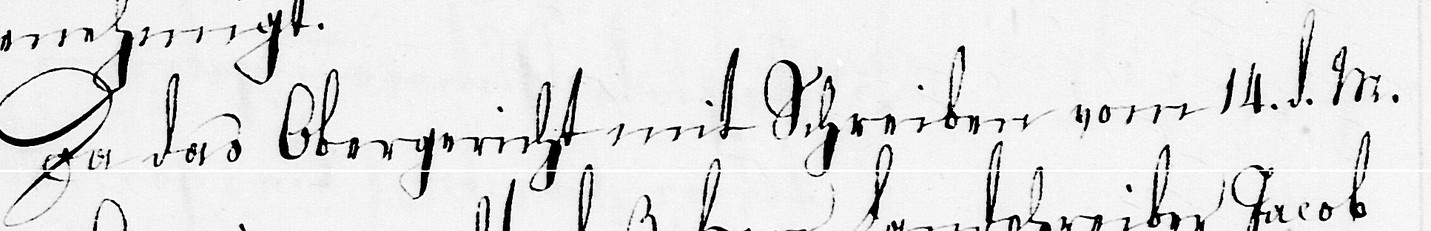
Da das Obergericht mit Schreiben vom 14. d. M.
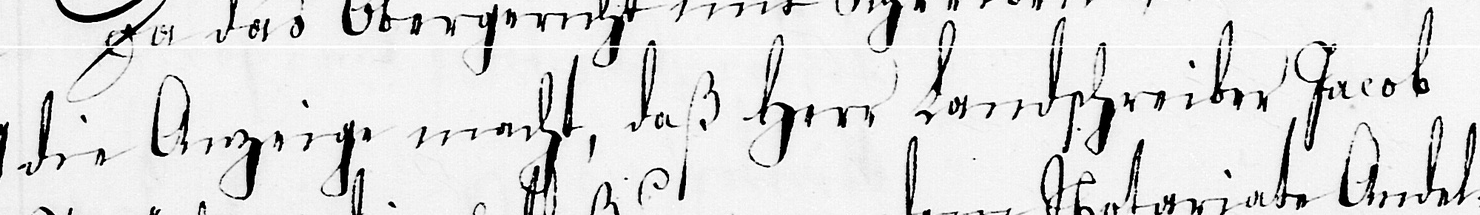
die Anzeige macht, daß Herr Landschreiber Jacob
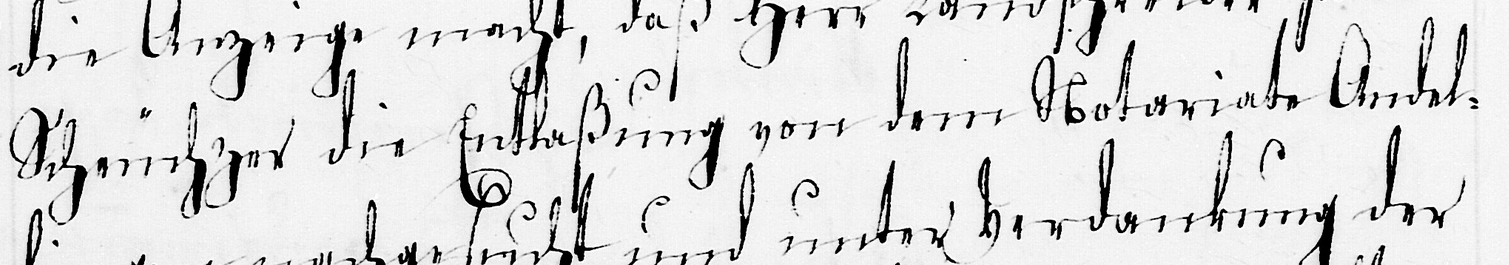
Scheuchzer die Entlaßung von dem Notariate Andel¬
